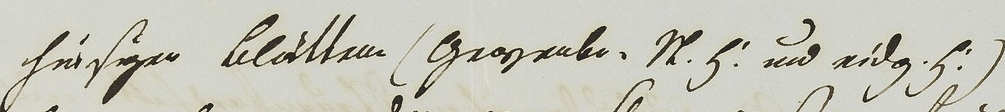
hiesigen Blättern (Gewerbe- N.Z. und eidg. Z.)
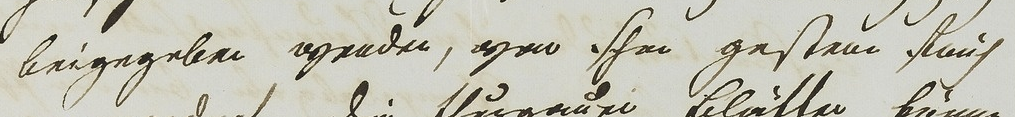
beigegeben werden, war schon gestern früh
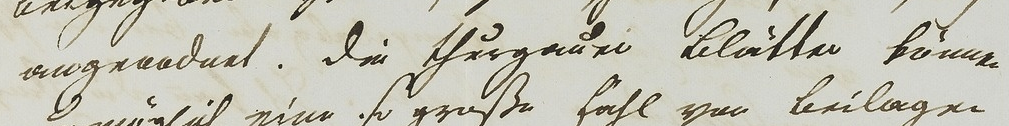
angeordnet. Die thurgauer Blätter können
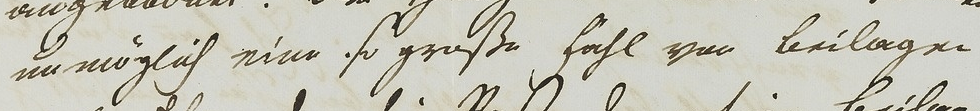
unmöglich eine so große Zahl von Beilagen
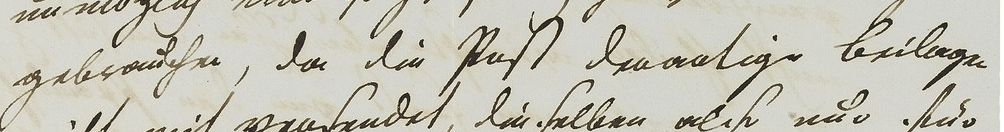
gebrauchen, da die Post derartige Beilagen
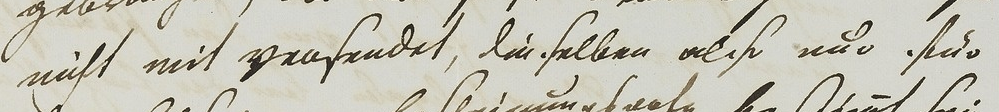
nicht mit versendet, dieselben also nur für
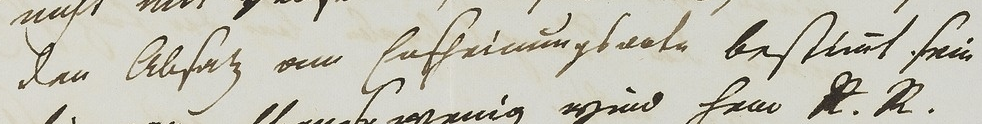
den Absatz am Erscheinungsorte bestimmt sein
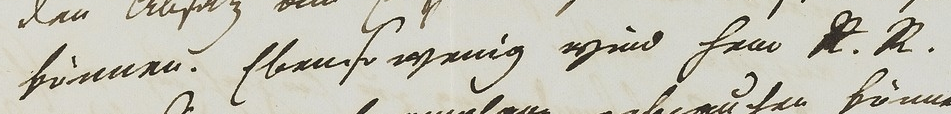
können. Ebenso wenig wird Herr R.R.
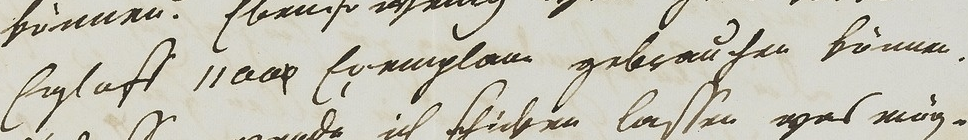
Egloff 11000 Exemplare gebrauchen können.
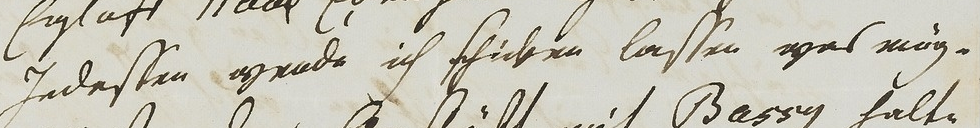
Indessen werde ich schicken lassen was mög-
